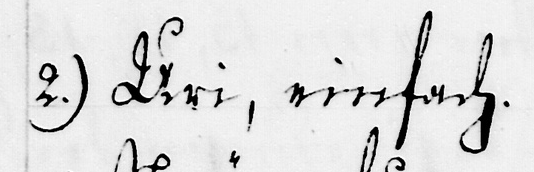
2.) Uri, einfach.
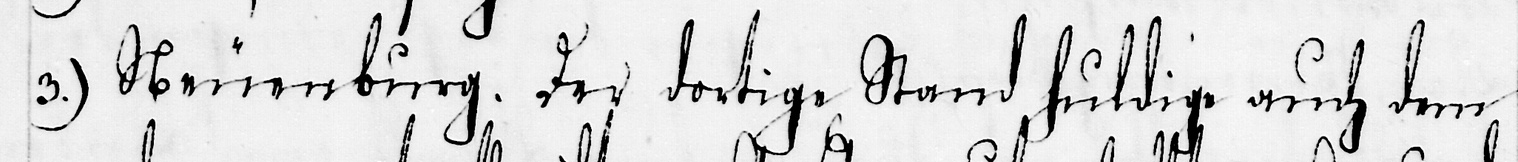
3.) Neuenburg. Der dortige Stand huldige auch dem
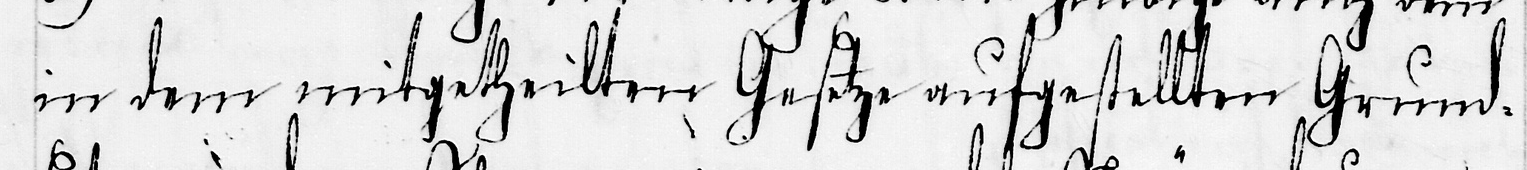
in dem mitgetheilten Gesetze aufgestellten Grund¬
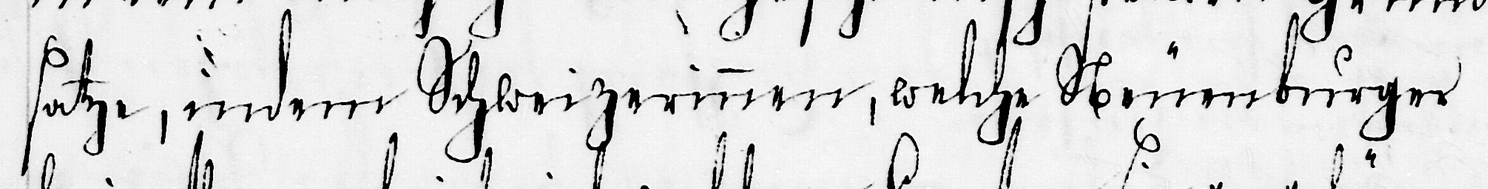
satze, indem Schweizerinnen, welche Neuenburger
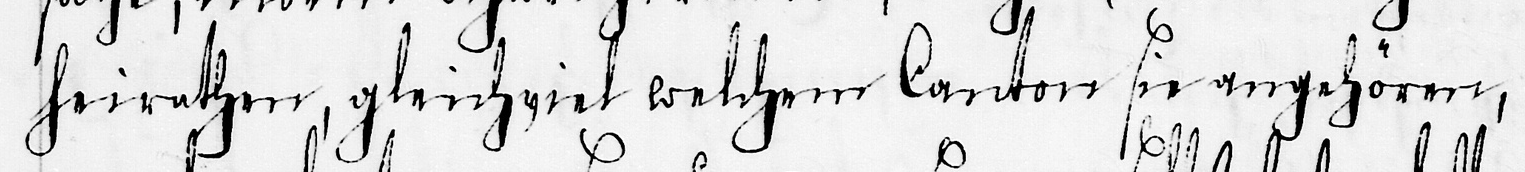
heirathen, gleichviel welchem Canton sie angehören,
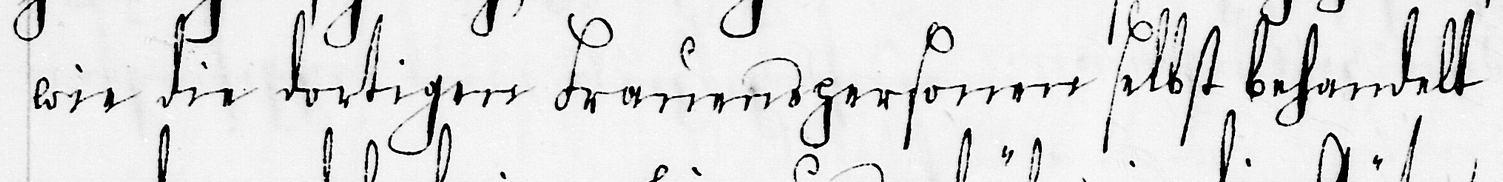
wie die dortigen Frauenspersonen selbst behandelt
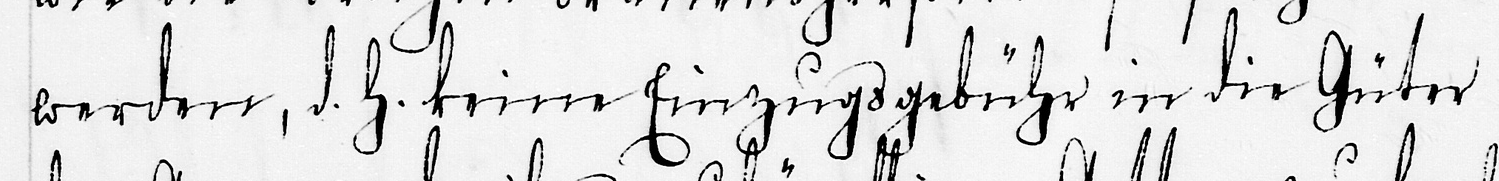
werden, d. h. keine Einzugsgebühr in die Güter
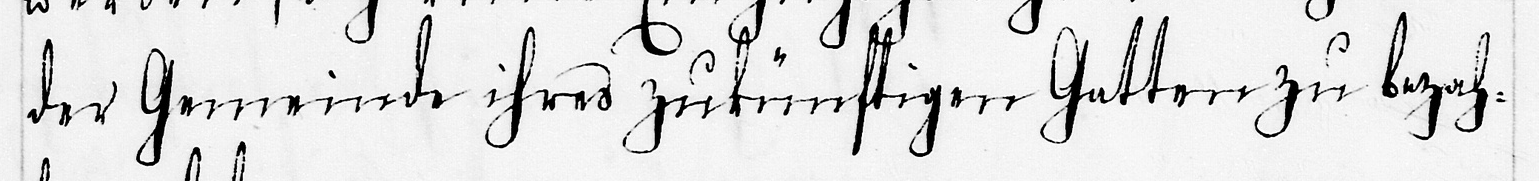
der Gemeinde ihres zukünftigen Gatten zu bezah¬
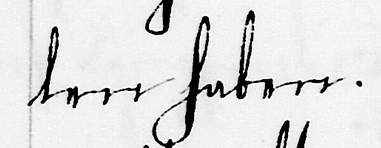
len haben.
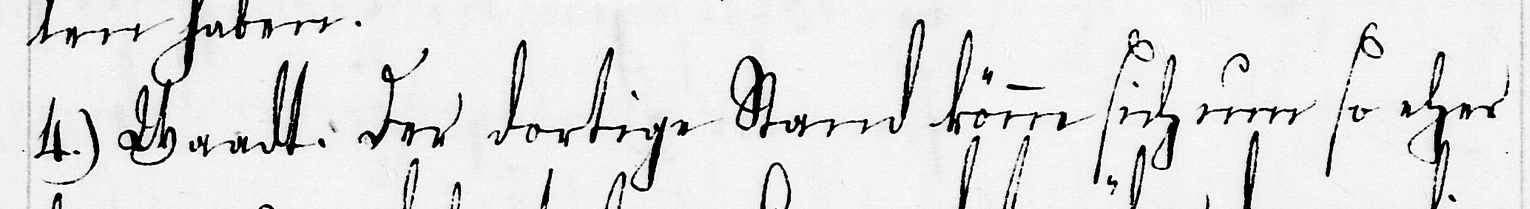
4.) Waadt. Der dortige Stand könne sich um so eher
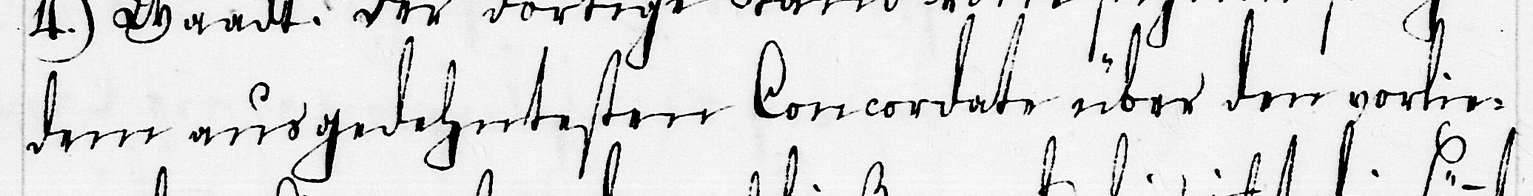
dem ausgedehntesten Concordate über den vorlie¬
